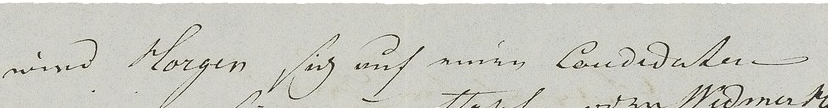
wird Horgen sich auf einen Candidaten
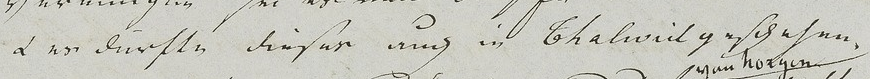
& es dürfte dieses auch in Thalweil geschehen,
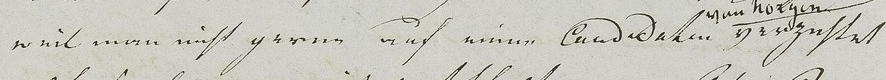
weil man nicht gerne auf einen Candidaten von Horgenverzichtet.
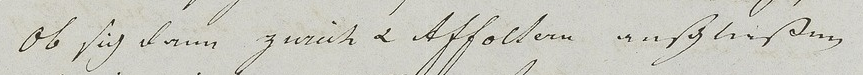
Ob sich dann Zürich & Affoltern aufgleißen,
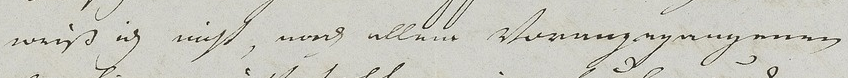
weiß ich nicht, nach allem Vorangegangenen
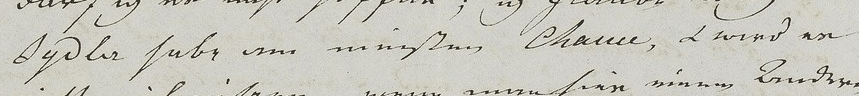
Sydler habe am meisten Chance, & wird es
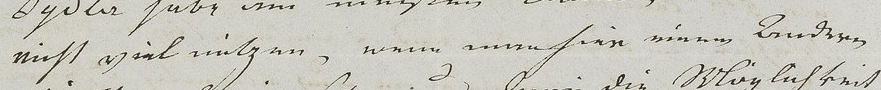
nicht viel nützen, wenn man hier einem Andern
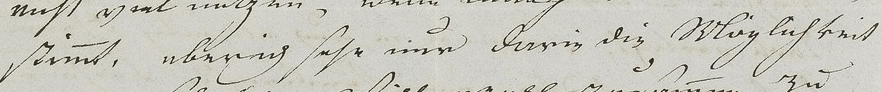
stimmt, aber ich sehe nur darin die Möglichkeit
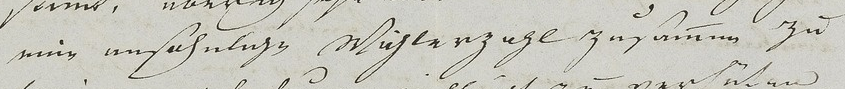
eine ansehnliche Wählerzahl zusammen zu
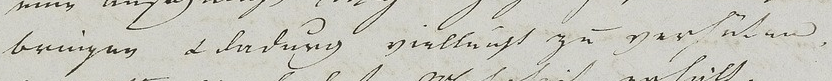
bringen & dadurch vielleicht zu verhüten,
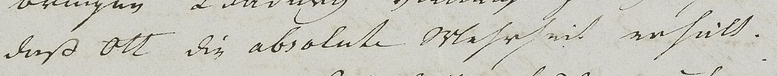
daß Ott die absolute Mehrheit erhält.
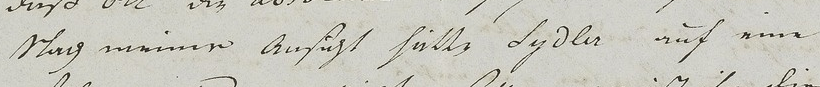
Nach meiner Ansicht hätte Sydler auf eine
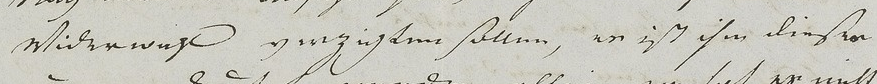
Widerwahl verzichten sollen, es ist ihm dieses
